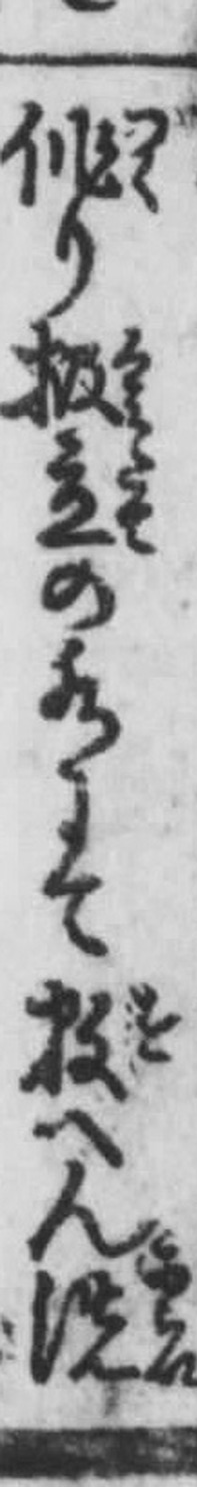作り汲立の水にて数へん洗
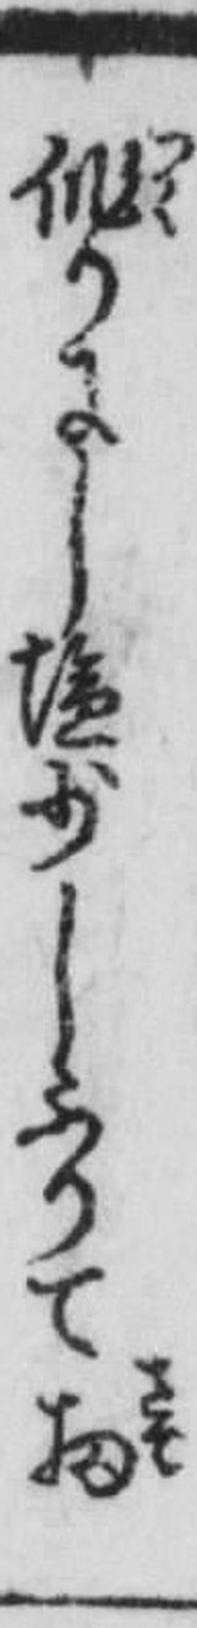作りにし塩少しふりて扨
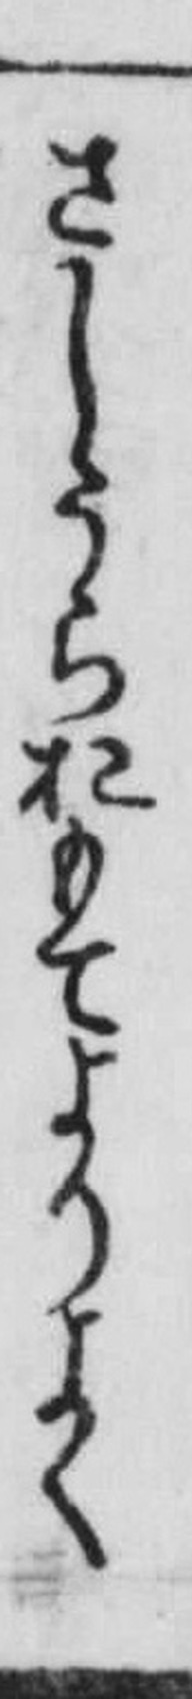さしうらおもてよりよく
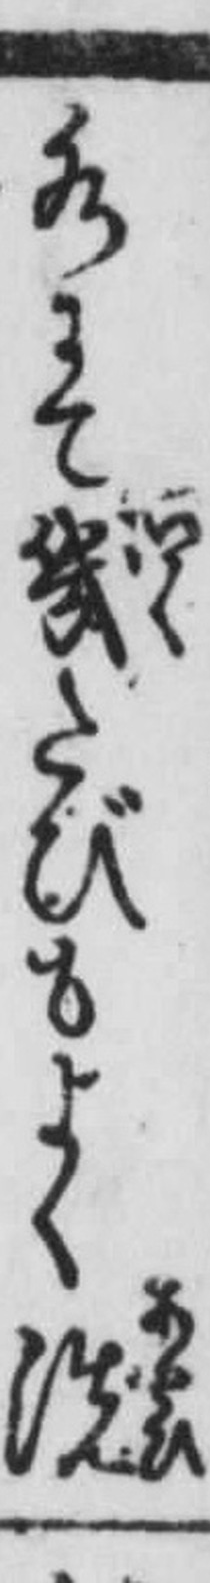水にて幾たびもよく洗
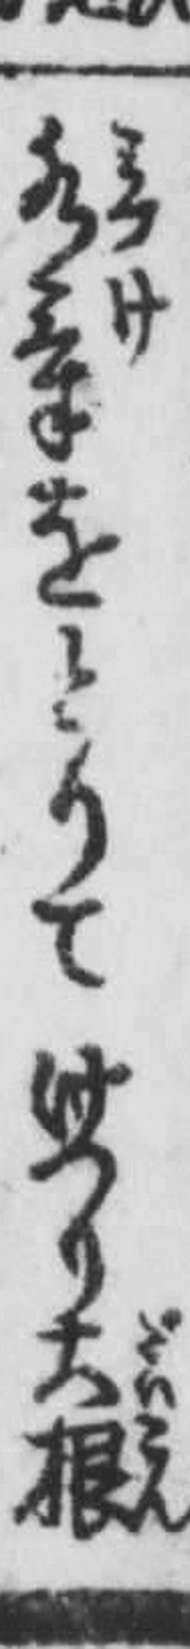水気をとりてけつり大根
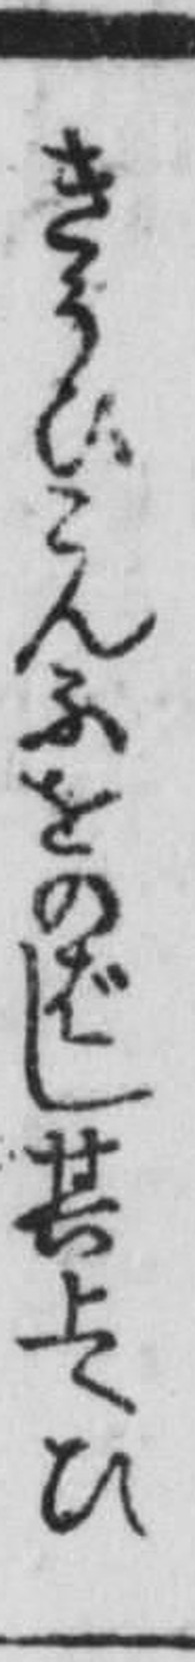きうひこんふをのばし其上へひ
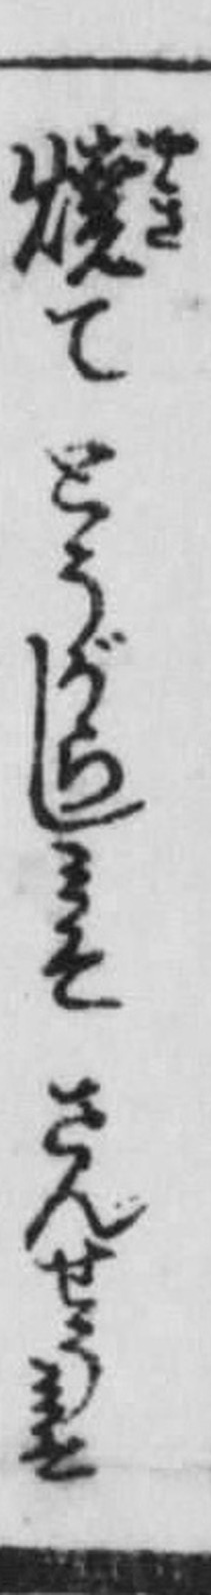焼てとうがらしみそさんせうみそ
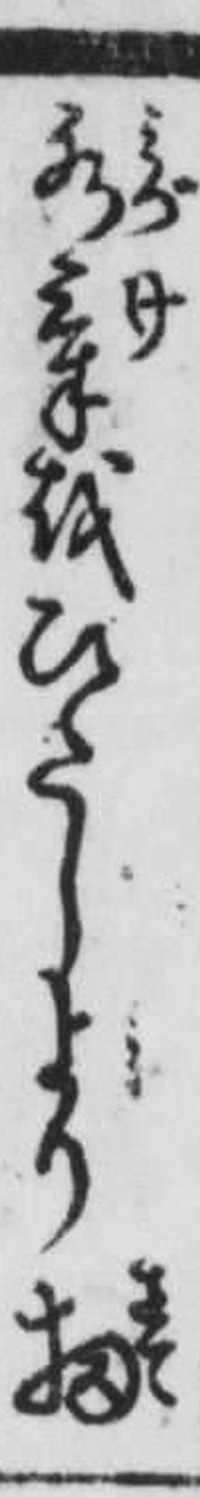水気をひたしより扨
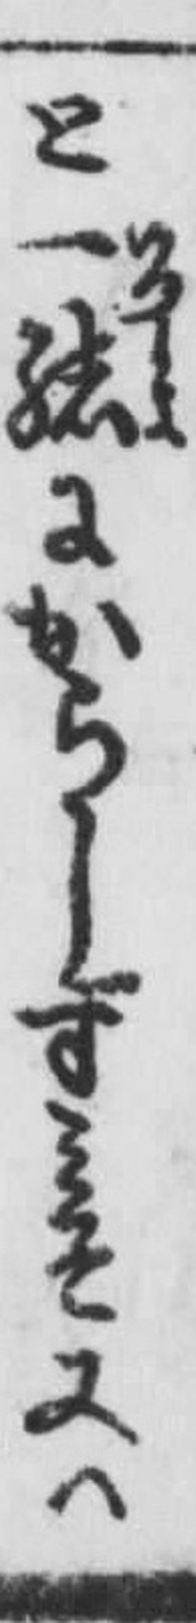と一緒にからしずみそ又は
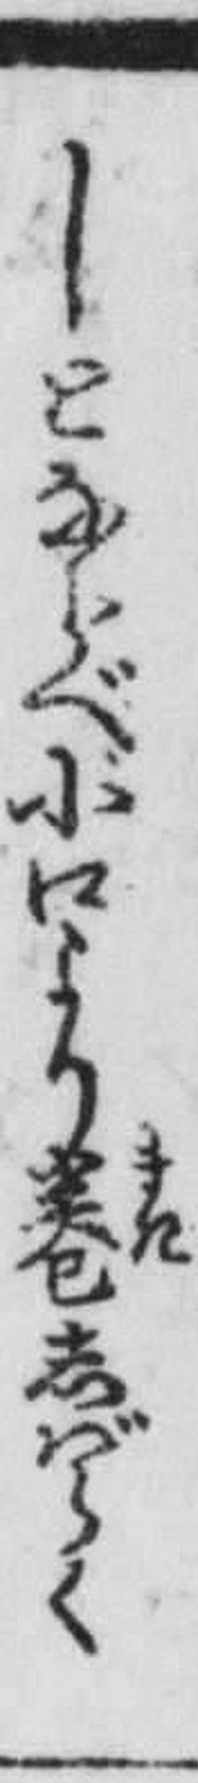しとならべ小口より巻しばらく
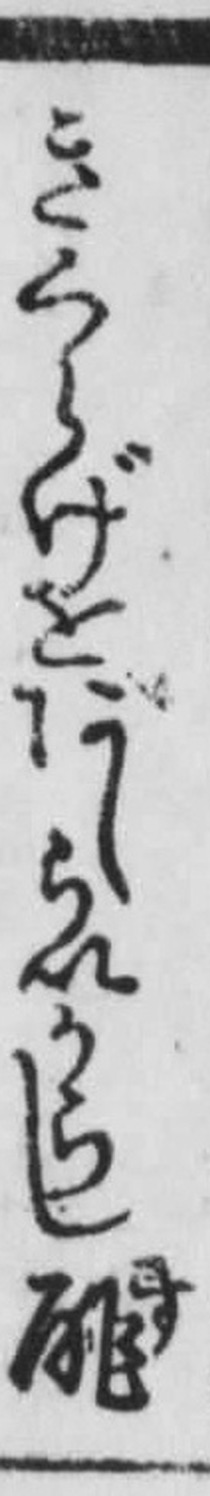きくらげをあしらいからし酢
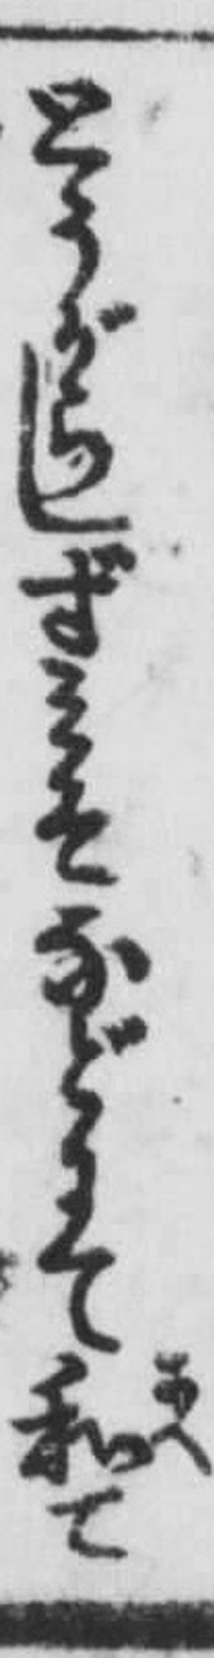とうがらしずみそなどにて和て
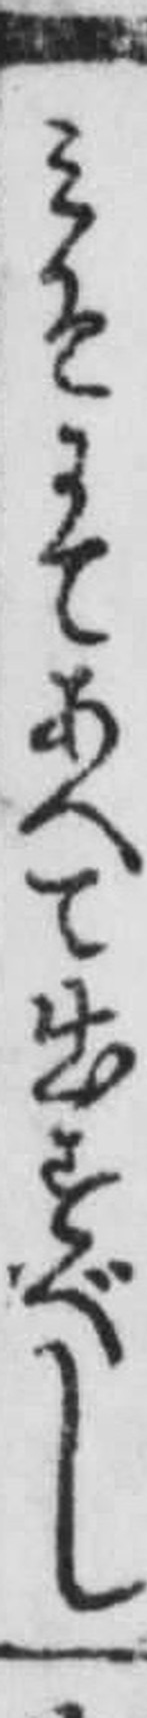みそにてあへて出すべし
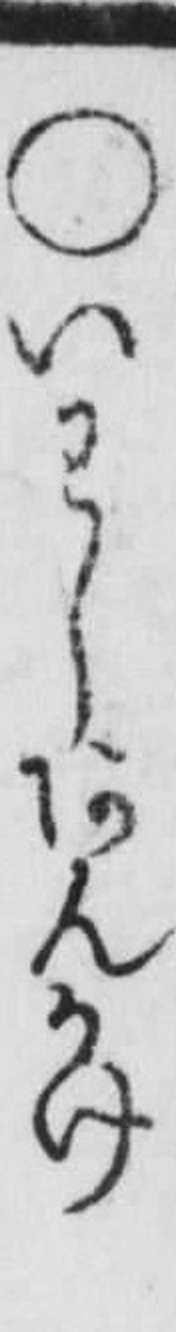○いわしあんかけ
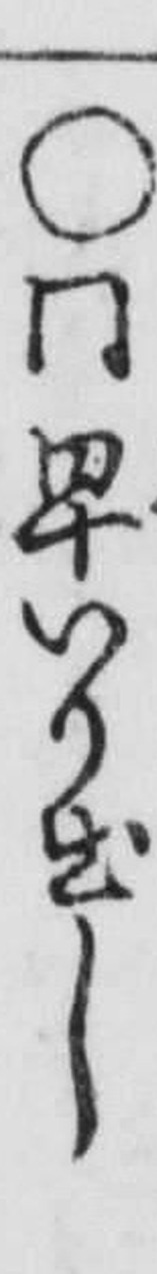○同早いり出し
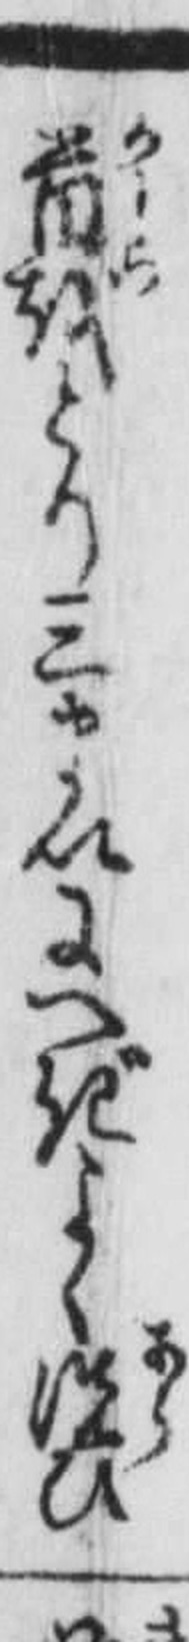首をとり三まいにへぎよく洗ひ
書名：精進魚類間合料理/早速庖丁
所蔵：大阪府立大学学術情報センター 国文学研究資料館
